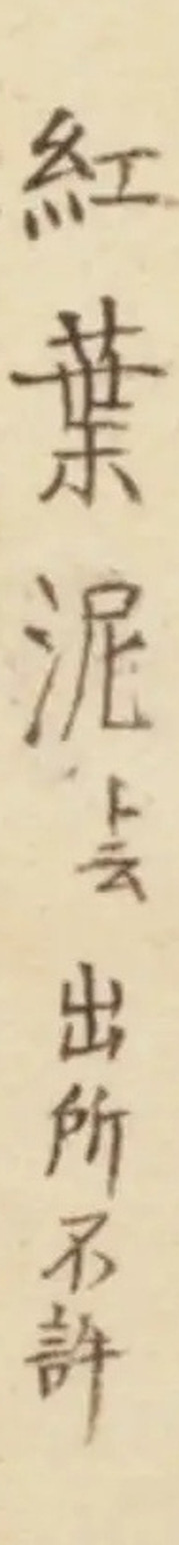紅葉泥と云出所不明
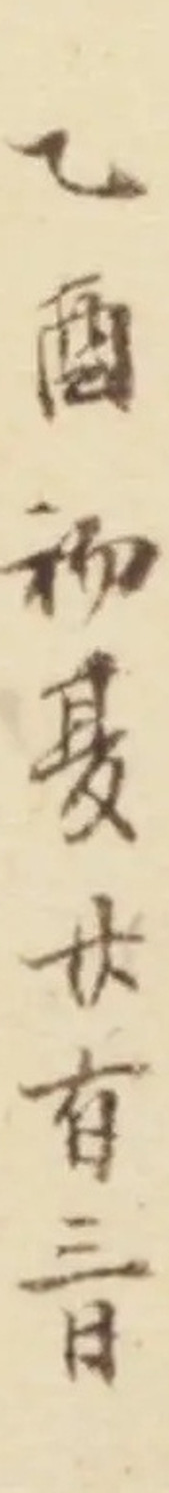乙酉初夏廿有三日

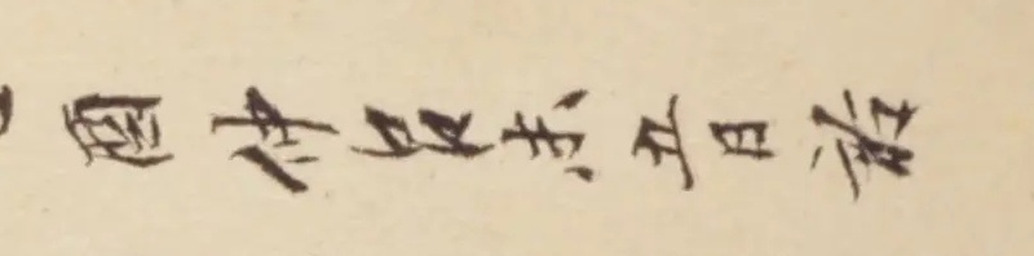乙酉仲呂末五日於
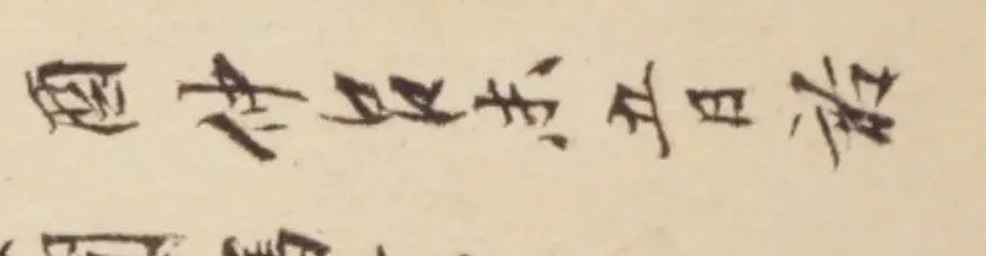乙酉仲呂末五日於
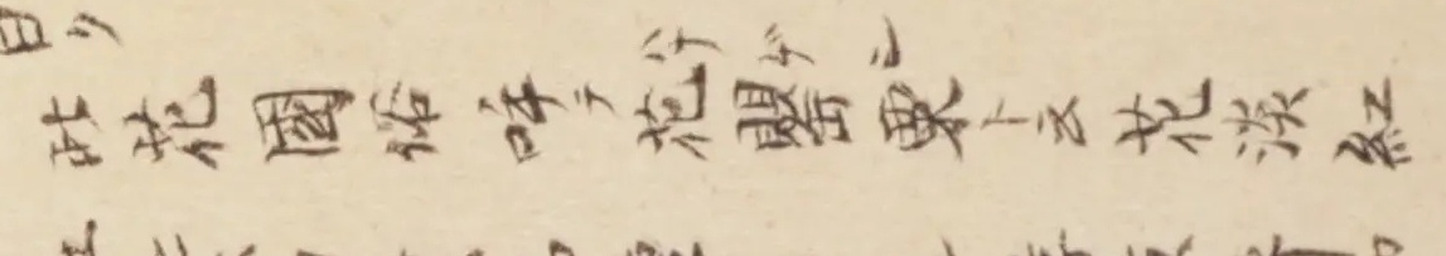此ノ花國俗呼テ花罌粟ト云花薄紅
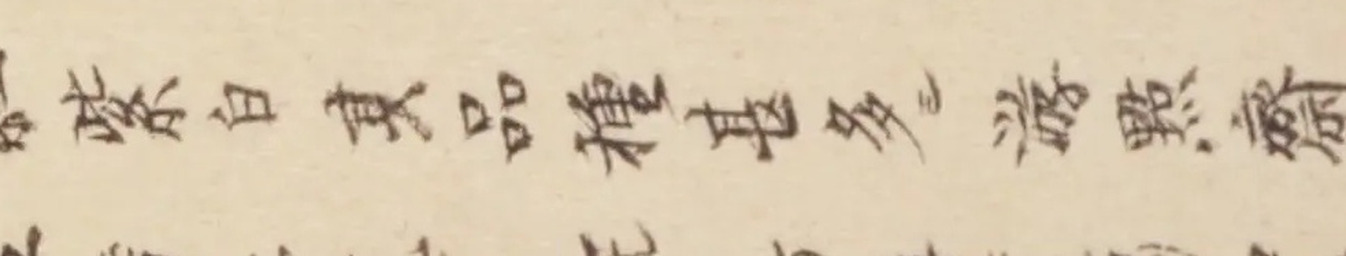紅紫白其品種甚多シ游黙齋カ
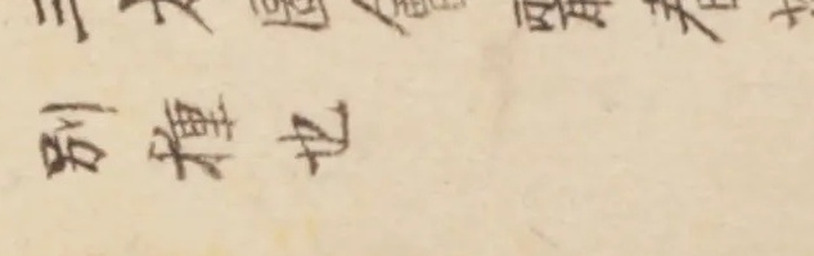別種也
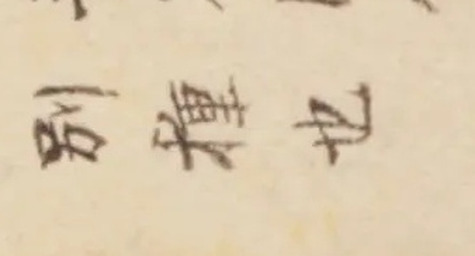別種也
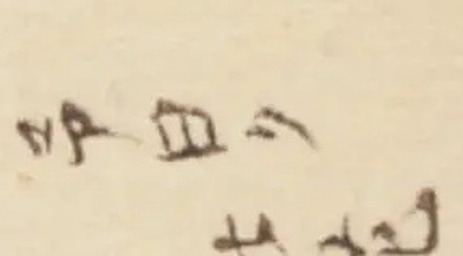予曰ク
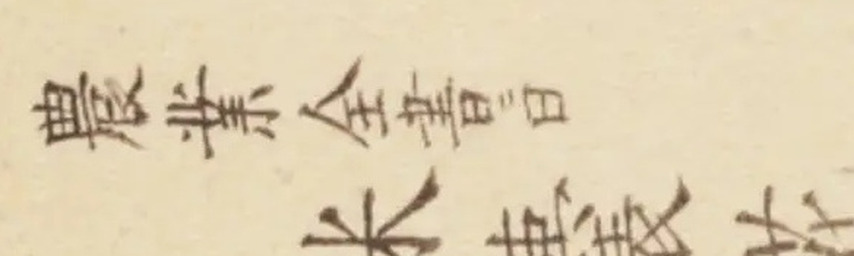農業全書ニ曰
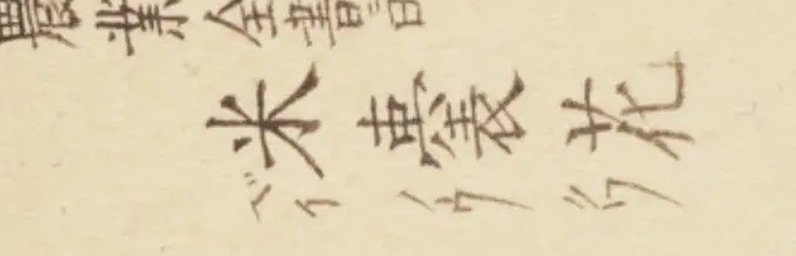米嚢花
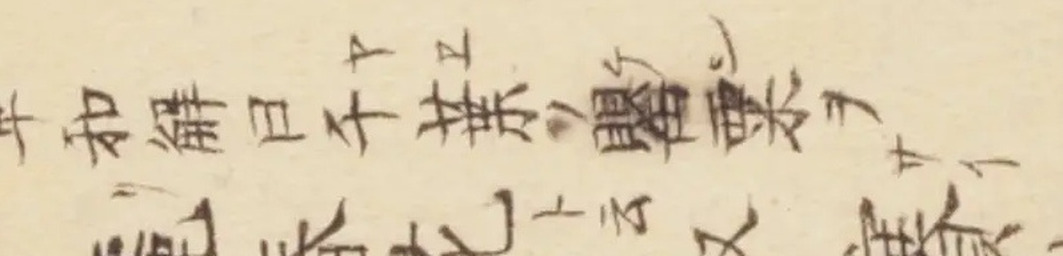本草和解千葉ノ罌粟ヲ
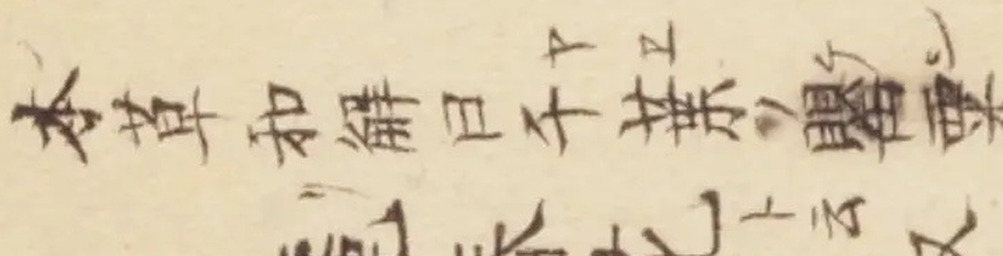本草和解千葉ノ罌粟ヲ
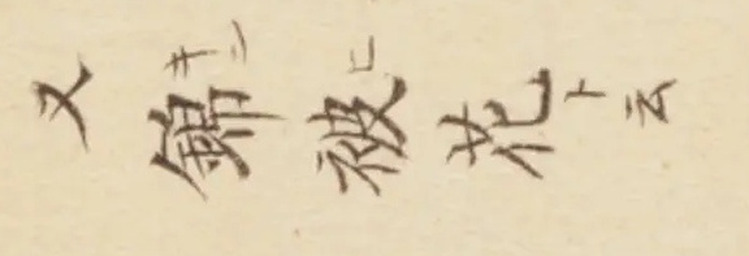又錦被花ト云
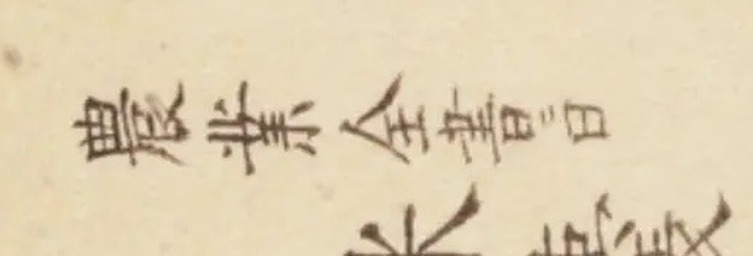農業全書ニ曰

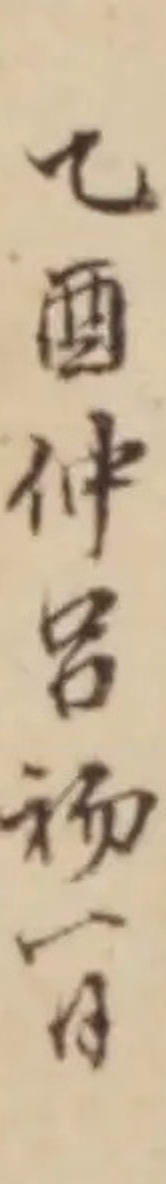乙酉仲呂初一日
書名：梅園草木花譜夏之部. 3
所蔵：国立国会図書館 National Diet Library, JAPAN
